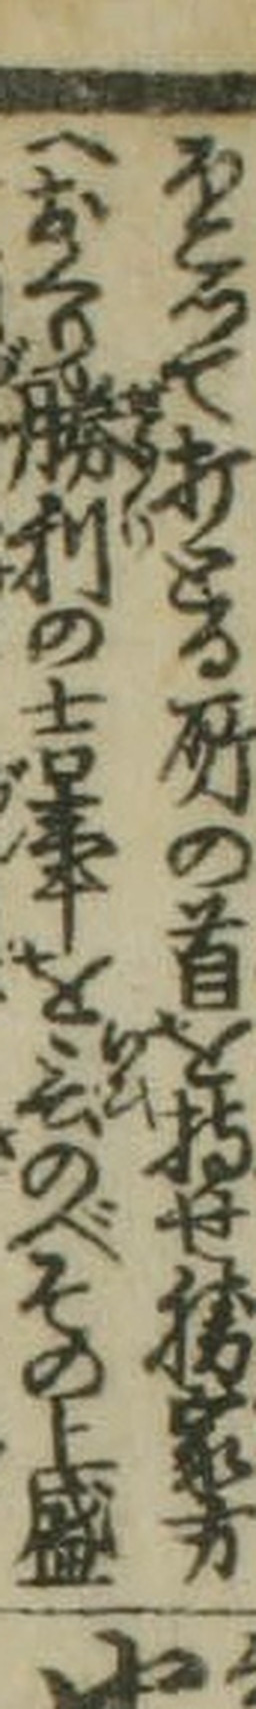へおくり勝利の吉事を言のべその上盛
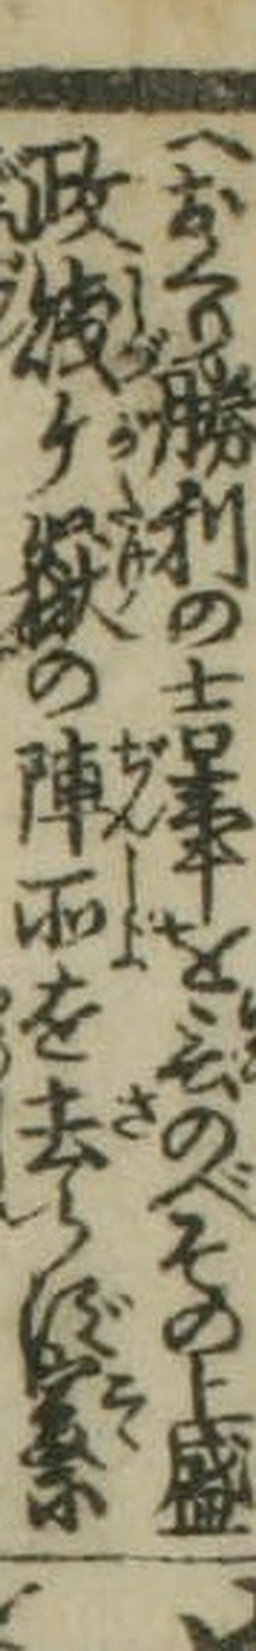政賤ヶ嶽のの陣所を去らず爰に
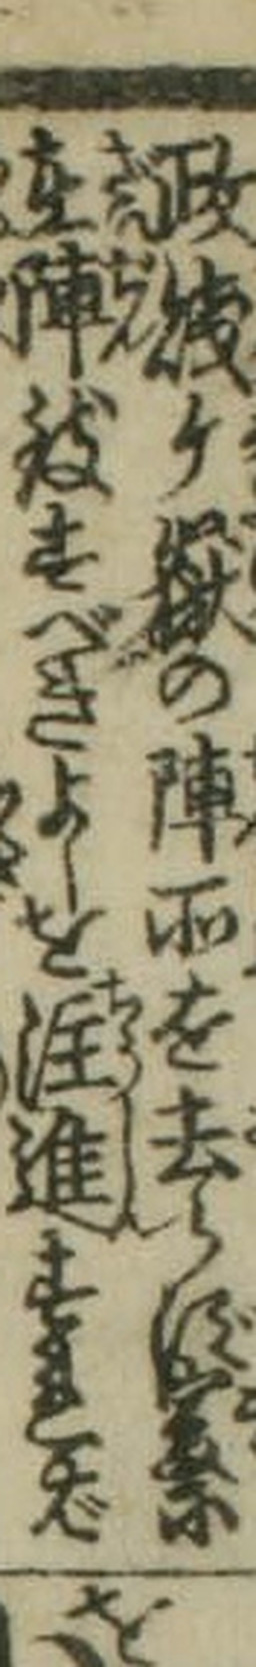在陣致すべきよしを注進すれば
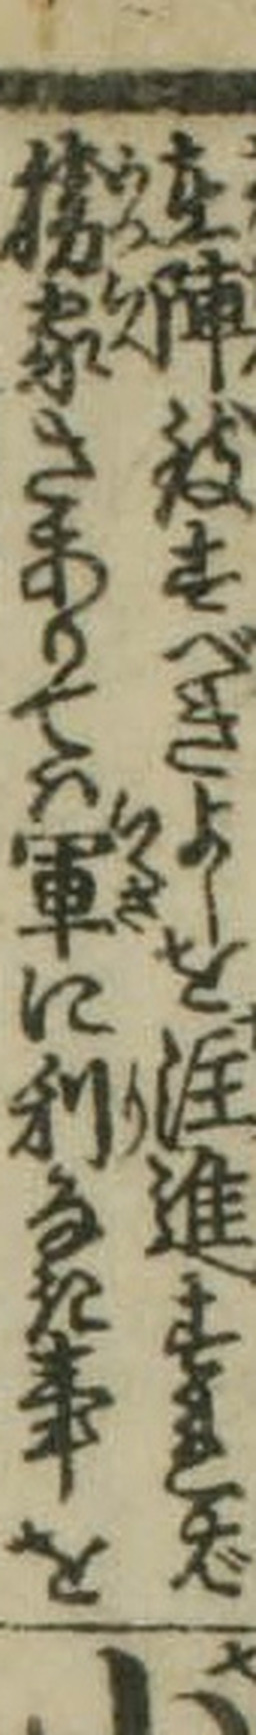勝家さありては軍に利なき事を
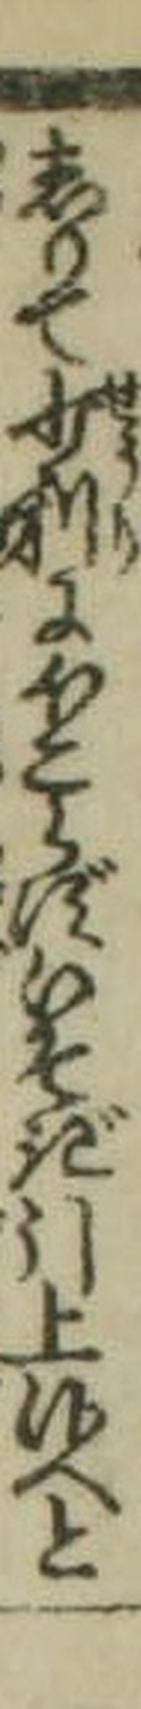しりて少利にほこらずいそぎ引上候へと
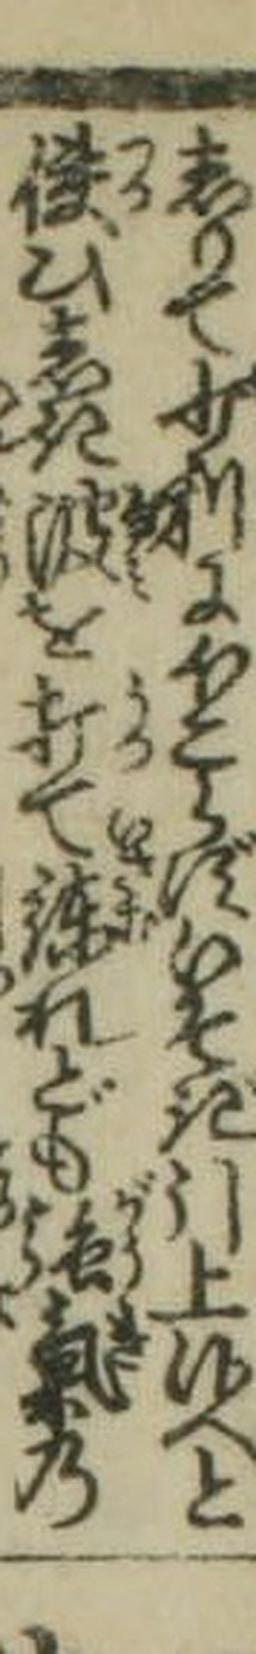使ひしき波を打て諫れども強気の
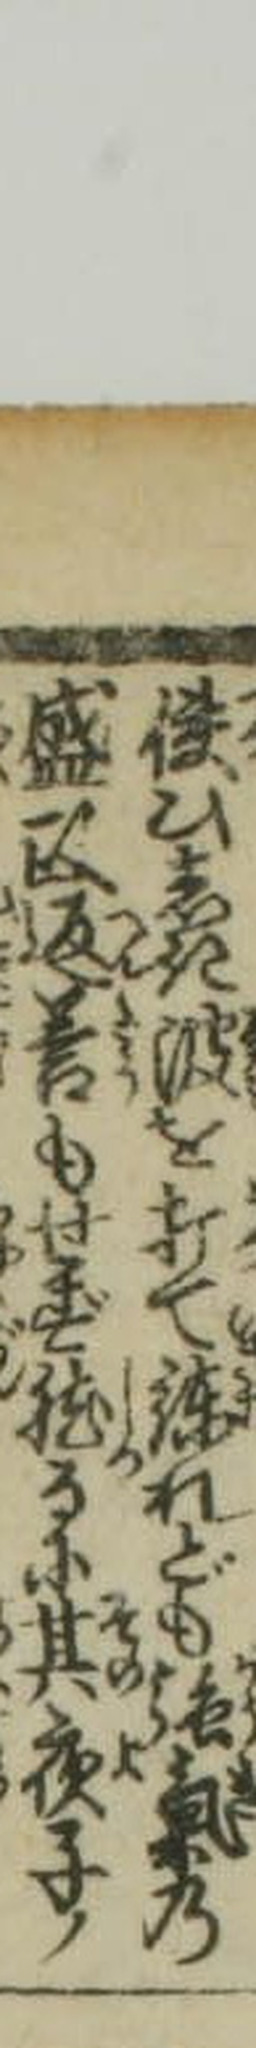盛政返答もせず然るに其夜子の
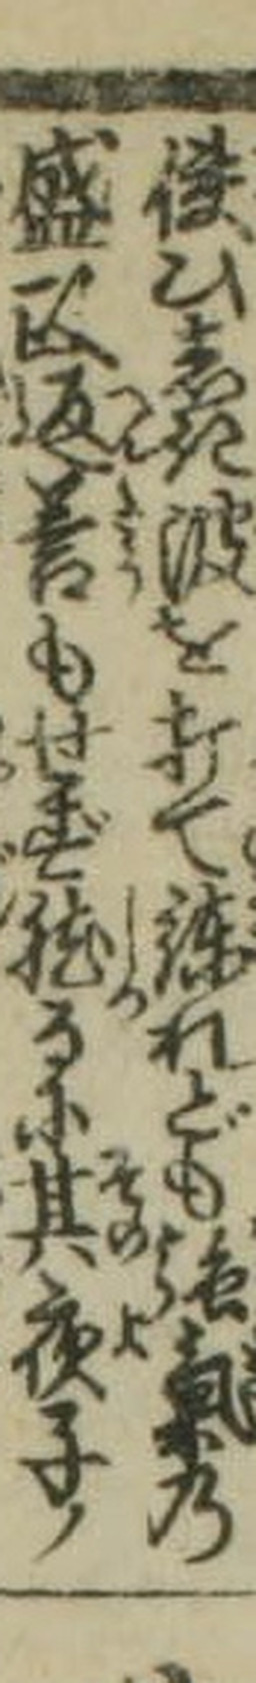盛政返答もせず然るに其夜子の
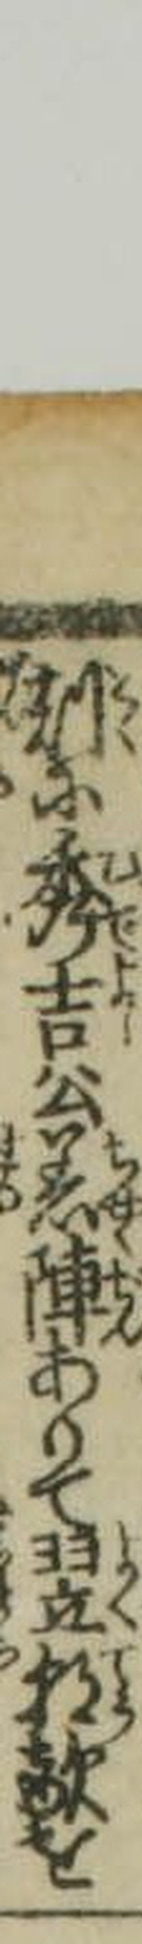刻に秀吉公着陣ありて翌朝敵を
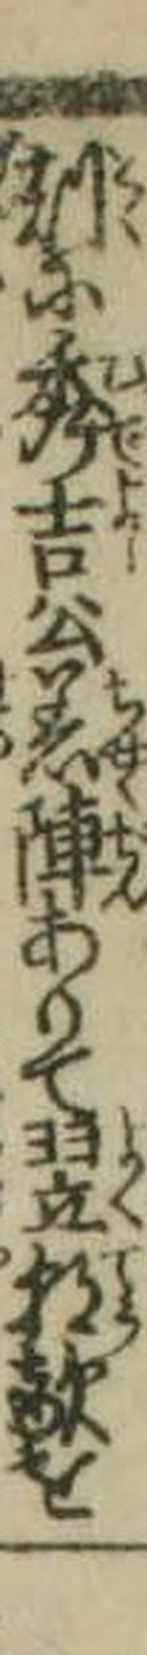刻に秀吉公着陣ありて翌朝敵を
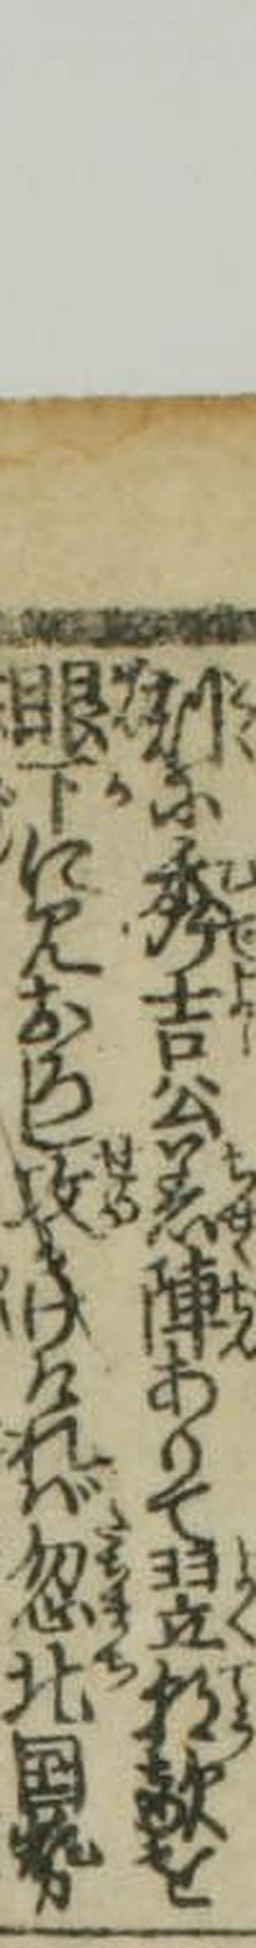眼下に見おろし攻かけければ忽北国勢
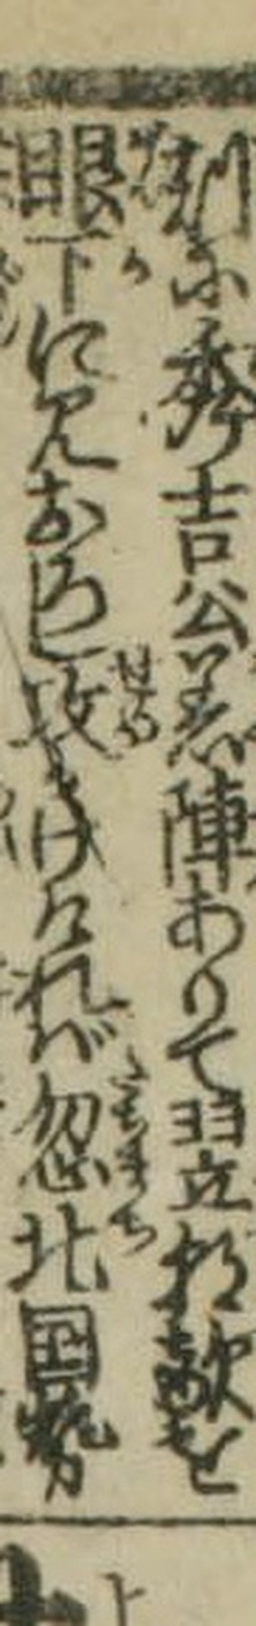眼下に見おろし攻かけければ忽北国勢
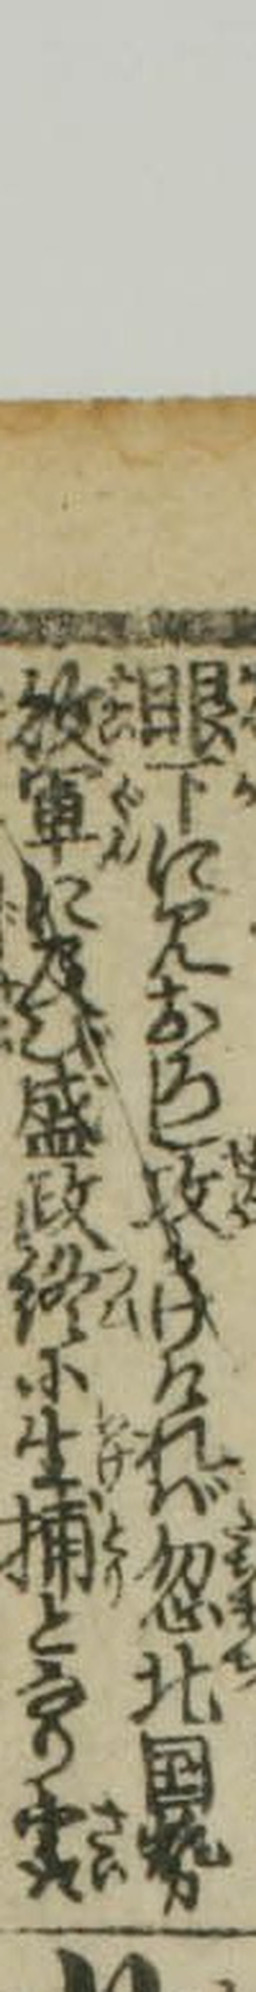敗軍に及び盛政終に生捕となり最
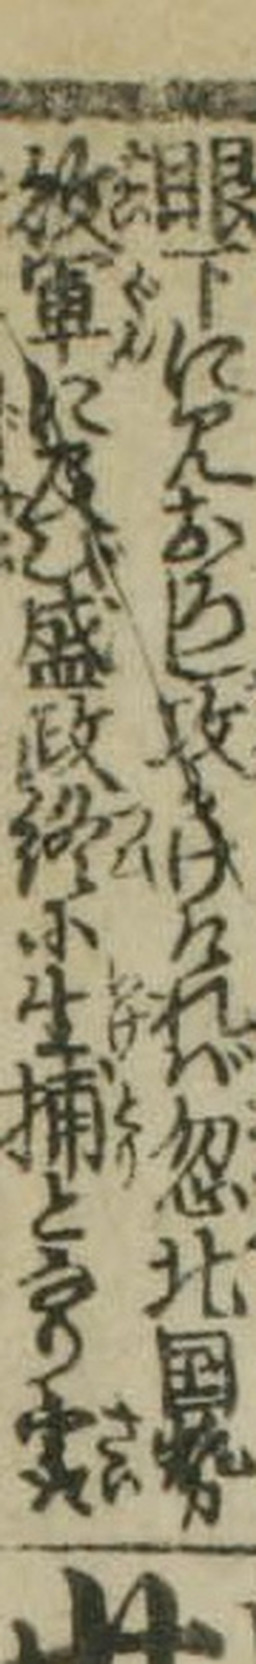敗軍に及び盛政終に生捕となり最
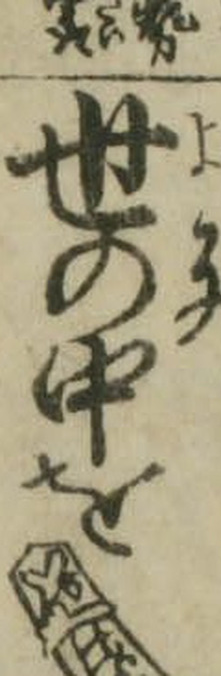世の中を
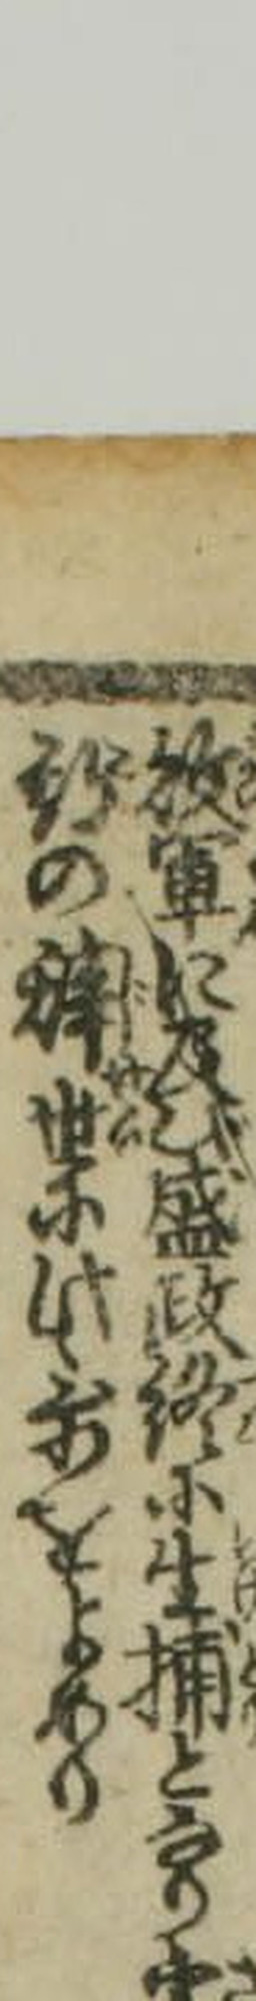期の辞世に此哥をよめり
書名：續英雄百人一首
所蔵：東京学芸大学附属図書館
